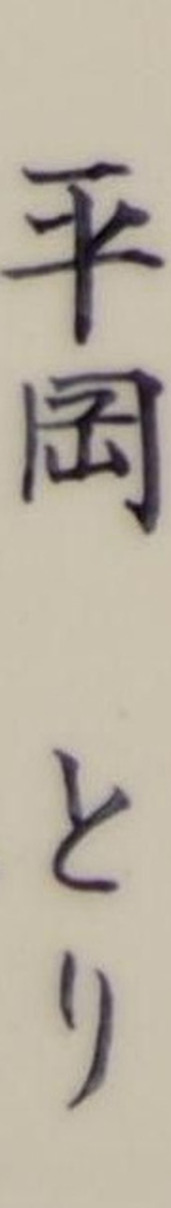平岡とり
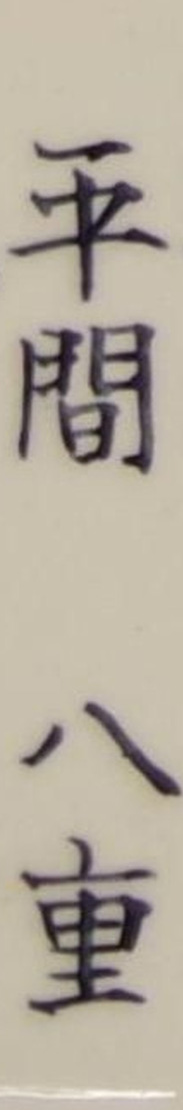平間八重
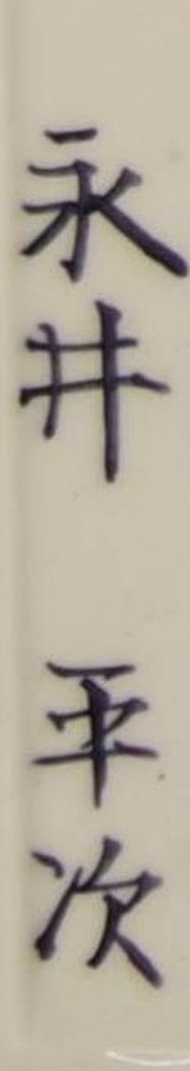永井平次

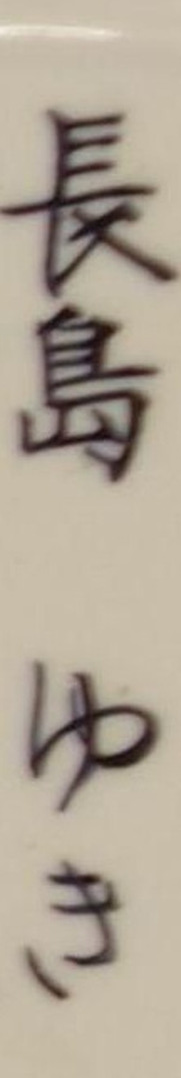長島ゆき
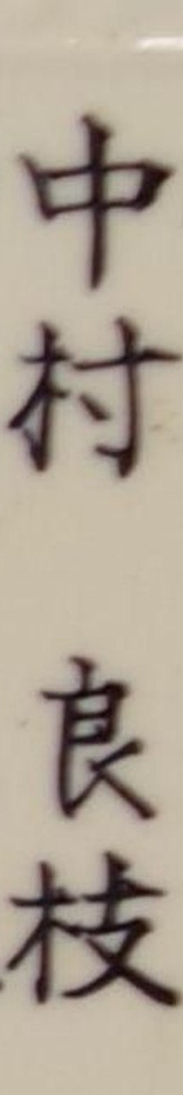中村良枝
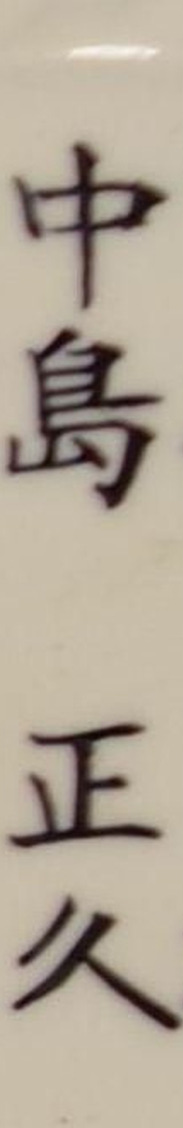中島正久
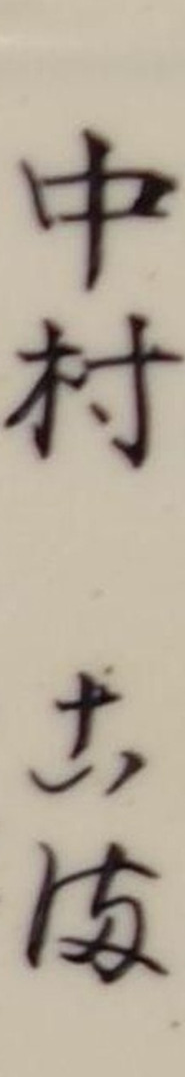中村こま
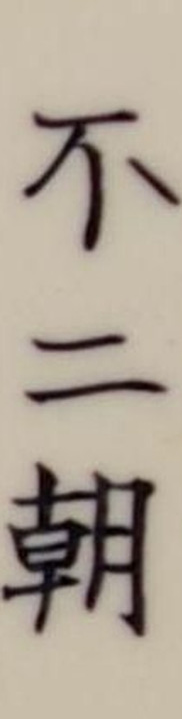不二朝
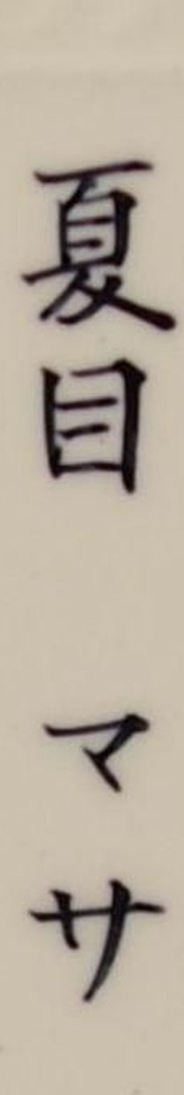夏目マサ
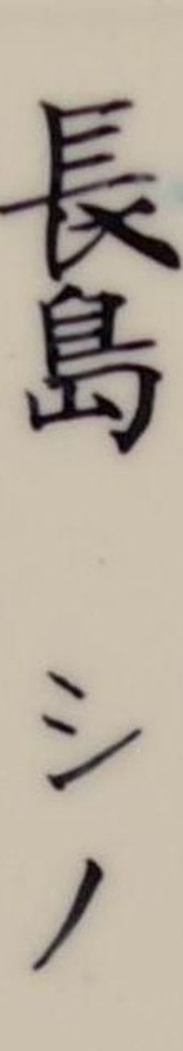長島シノ
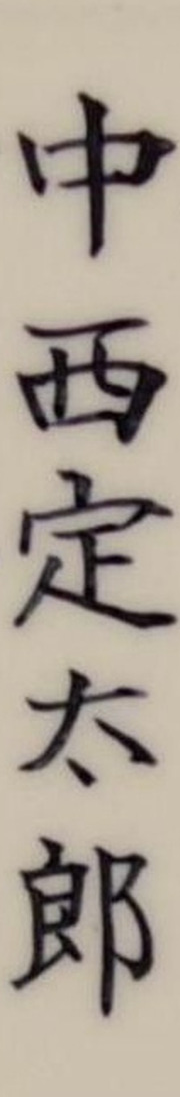中西定太郎
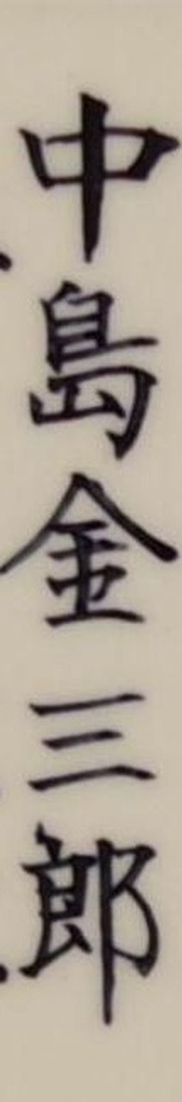中島金三郎
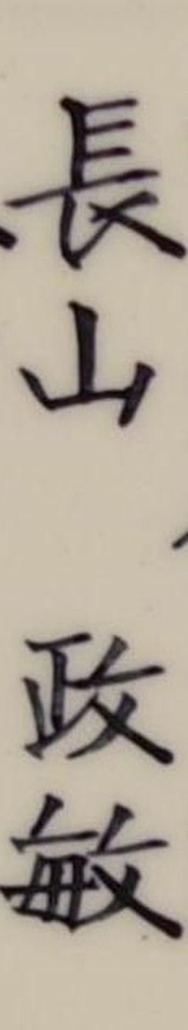長山政敏
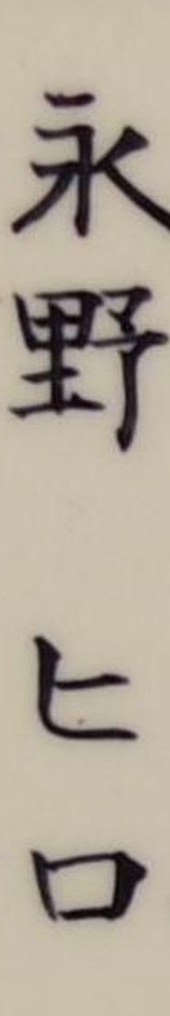永野ヒロ
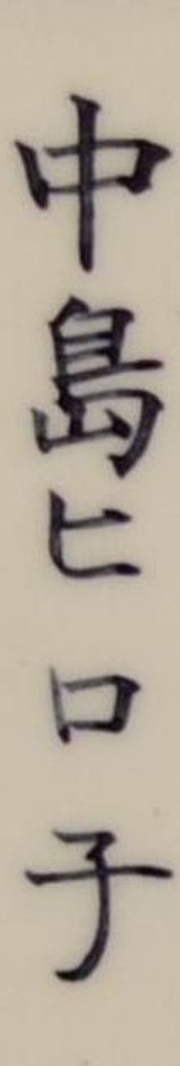中島ヒロ子
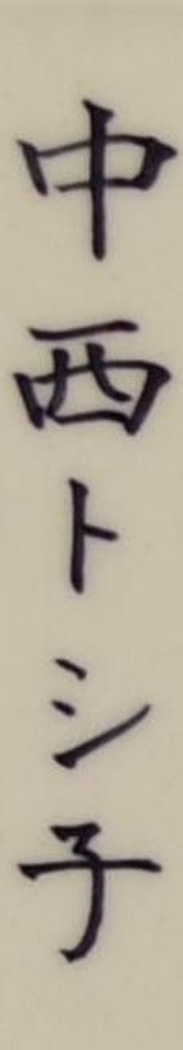中西トシ子
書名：M~S
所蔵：高野山金剛峯寺
